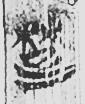楚
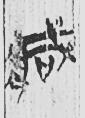戕
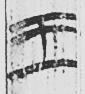王
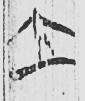立
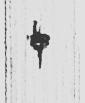十
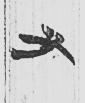又
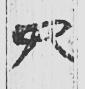四
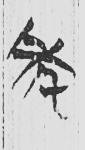年
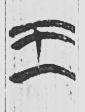王
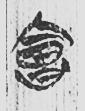會
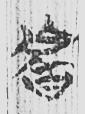者
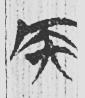侯
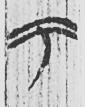于
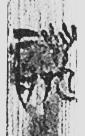{酉萬}
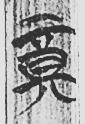奠
